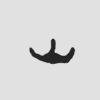山
